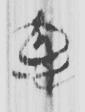{龴口人心}
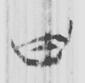甘
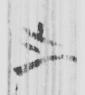之
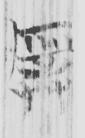{厂丵廾}
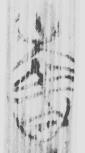{南甘}
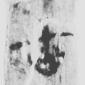古
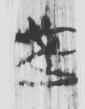武
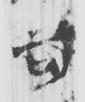可
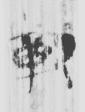{車卩}
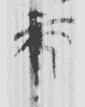而
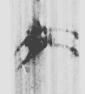文
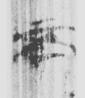不
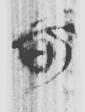可
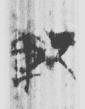{車卩}
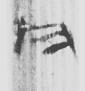今
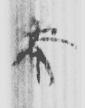夫
